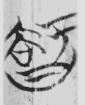智
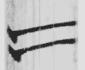二
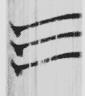三
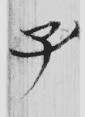子
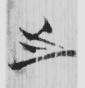之
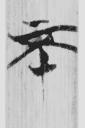不
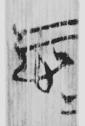二心=
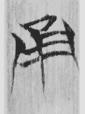甬
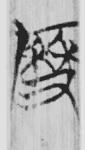{厤又}
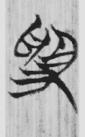受
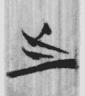之
